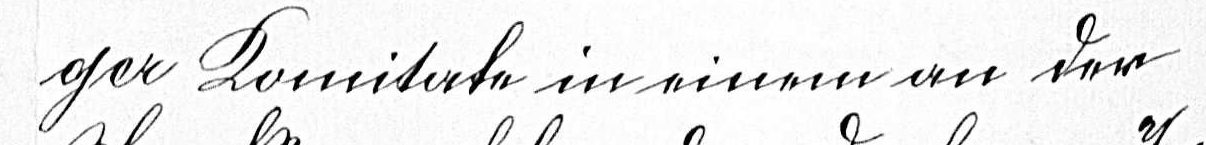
ger Komitate in einem an der
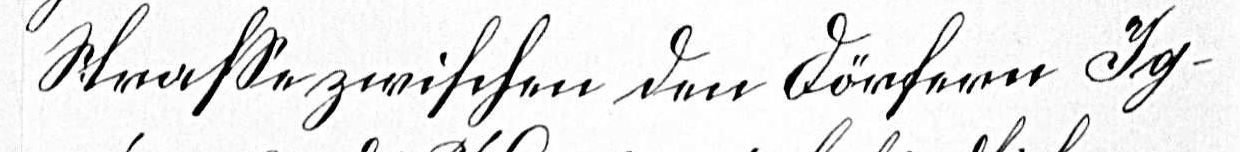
Straße zwischen den Dörfern Jg¬
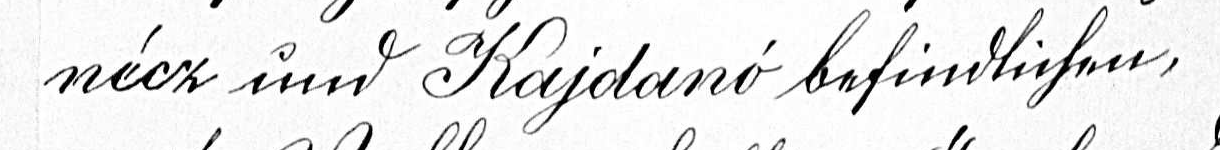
nécz und Kajdanó befindlichen,
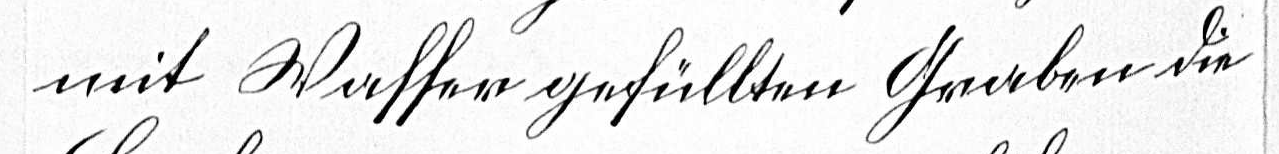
mit Wasser gefüllten Graben die
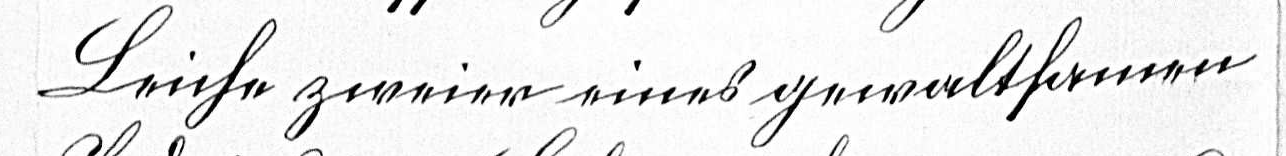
Leiche zweier eines gewaltsamen
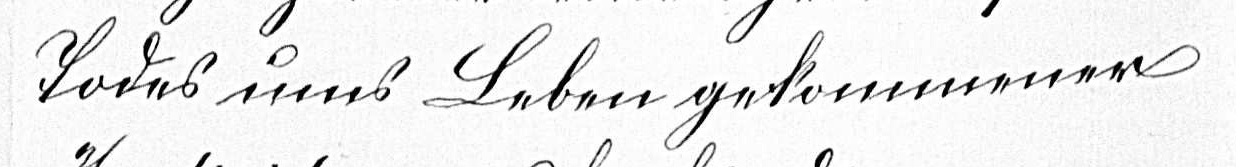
Todes ums Leben gekommener
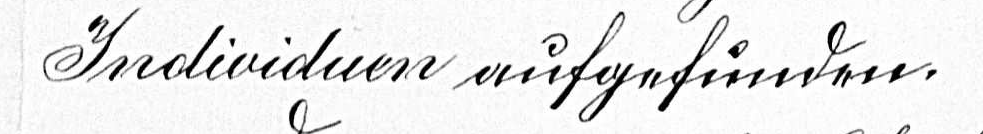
Jndividuen aufgefunden.
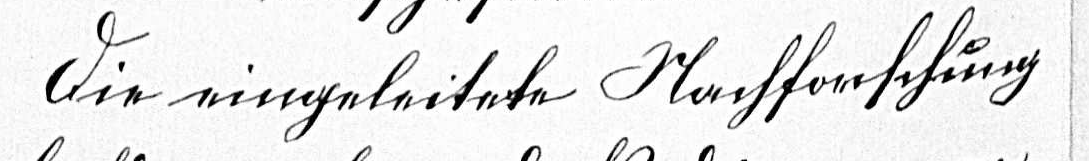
Die eingeleitete Nachforschung
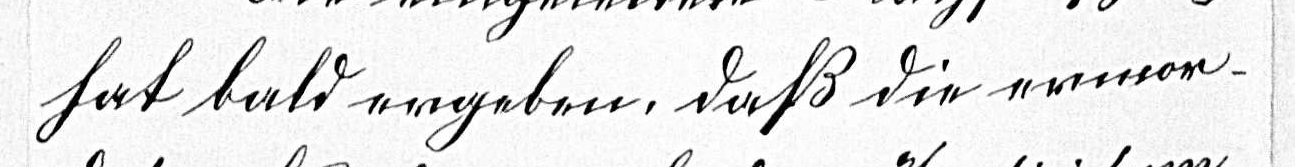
hat bald ergeben, daß die ermor¬
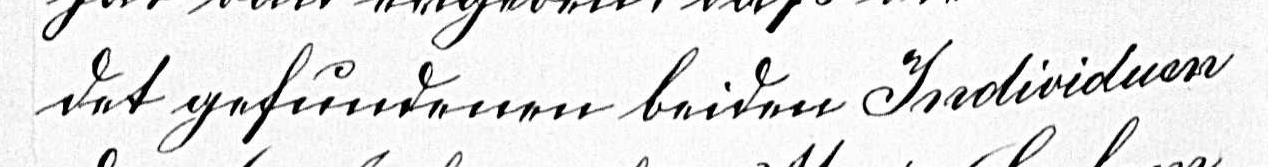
det gefundenen beiden Jndividum
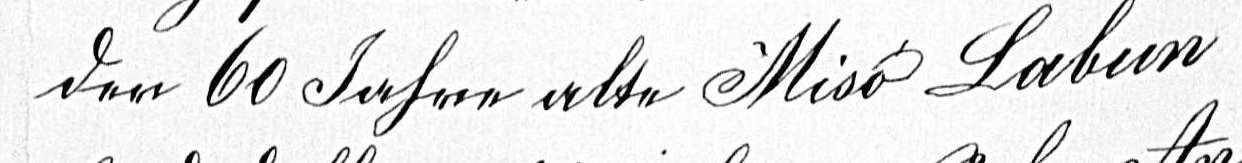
der 60 Jahre alte Misó Labun
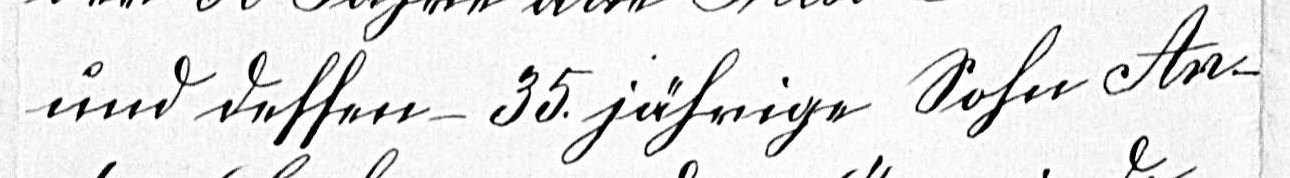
und dessen - 35. jährige Sohn An¬
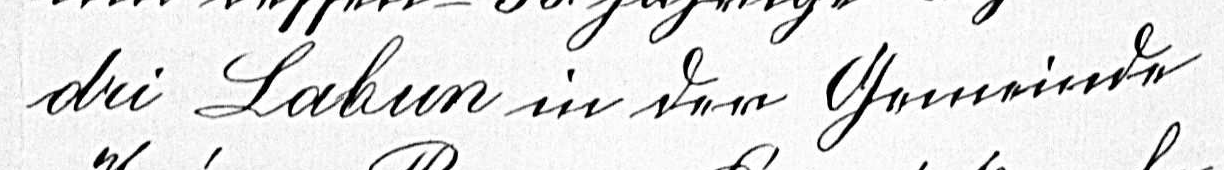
dri Labun in der Gemeinde
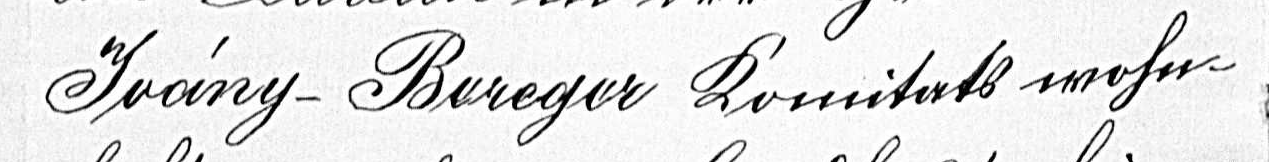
Ivány-Bureger Komitats wohn¬
